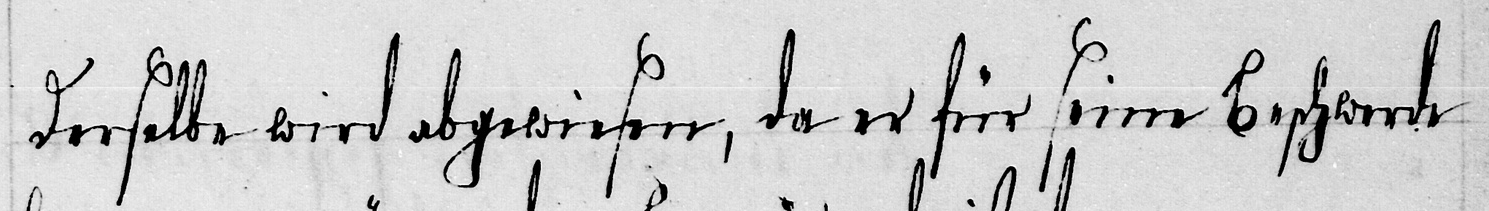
Derselbe wird abgewiesen, da er für seine Beschwerde
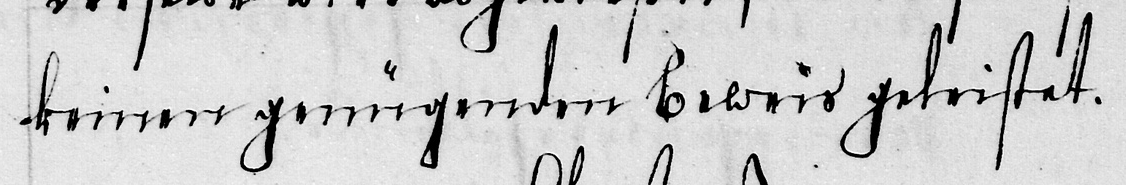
keinen genügenden Beweis geleistet.
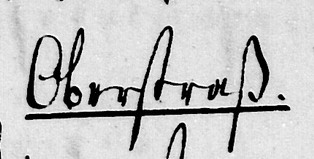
Oberstraß.
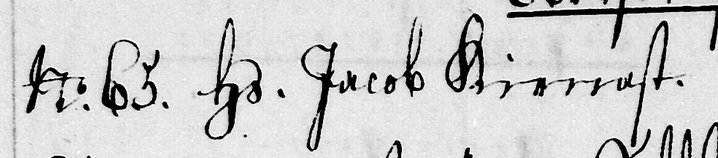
No. 65. Hs. Jacob Kienast.
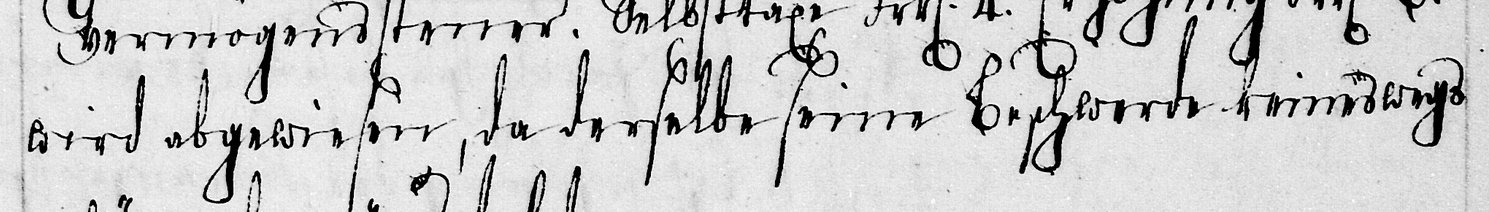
wird abgewiesen, da derselbe seine Beschwerde keineswegs
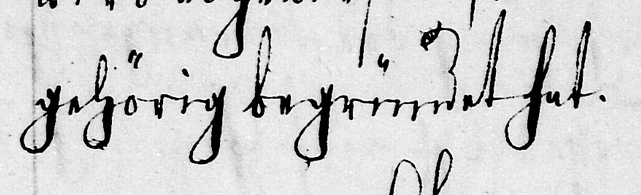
gehörig begründet hat.
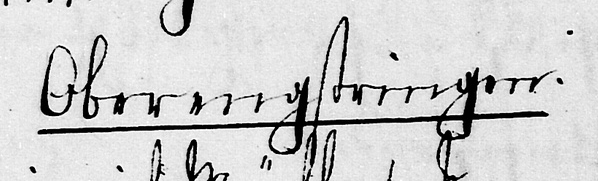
Oberengstringen.
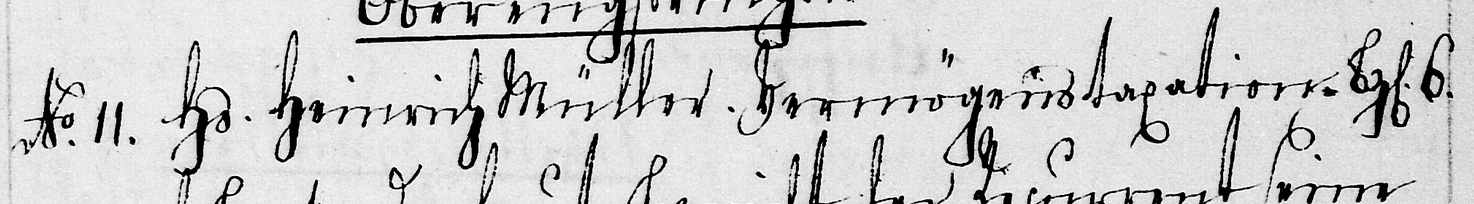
No. 11. Hs. Heinrich Müller. Vermögenstaxation Bz[en].
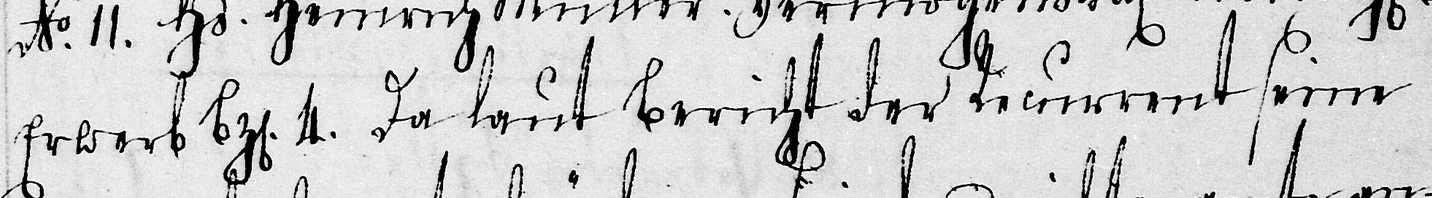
Erwerb Bz[en]. 4. Da laut Bericht der Recurrent seine
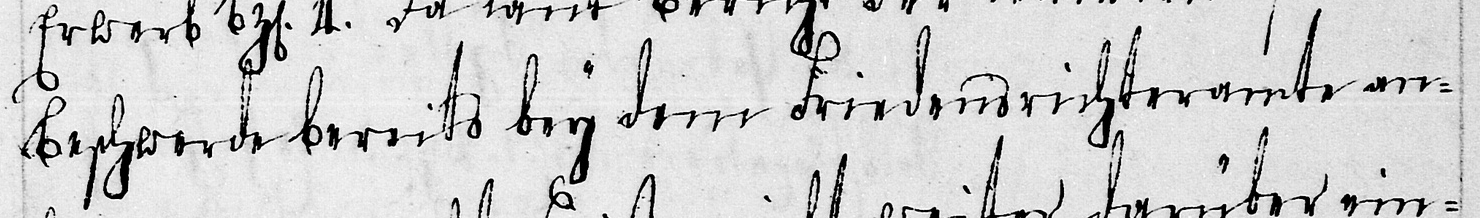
Beschwerde bereits bey dem Friedensrichteramte an¬
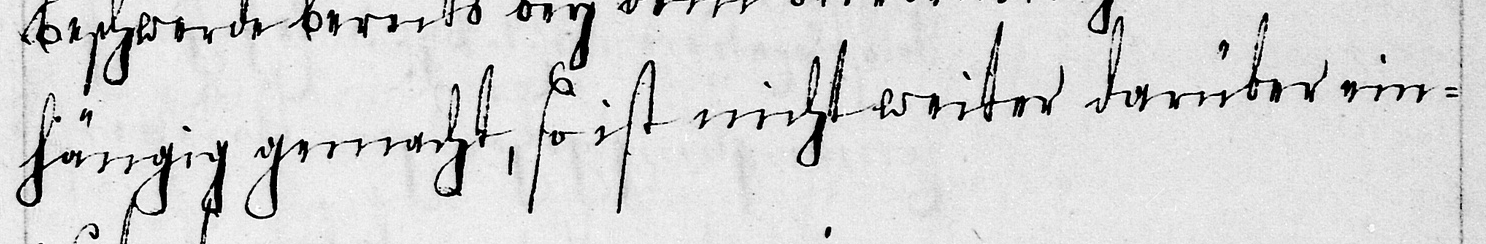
hängig gemacht, so ist nicht weiter darüber ein¬
